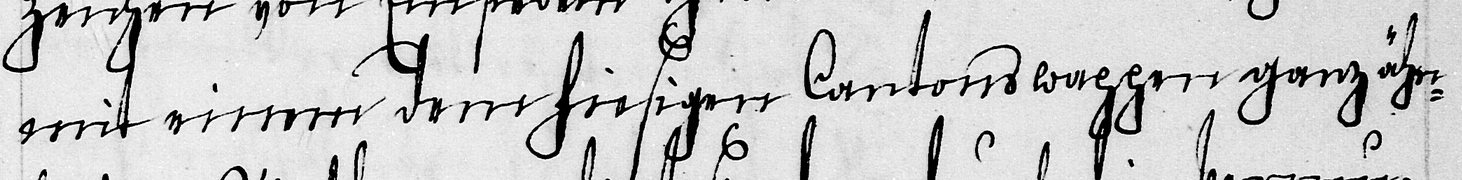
mit einem dem hiesigen Cantonswappen ganz ähn¬
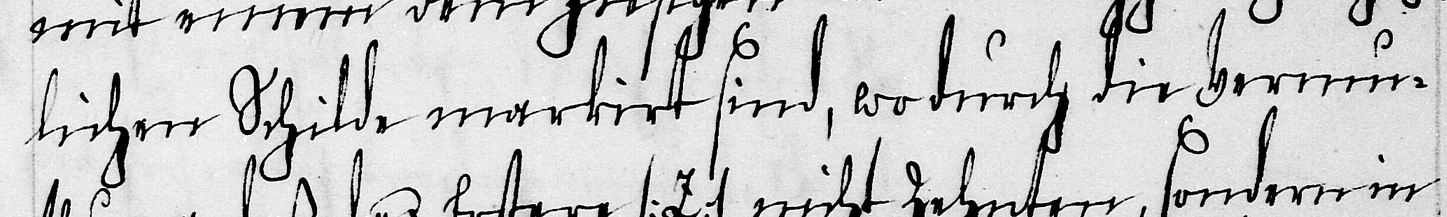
lichen Schilde markirt sind, wodurch die Vermu¬
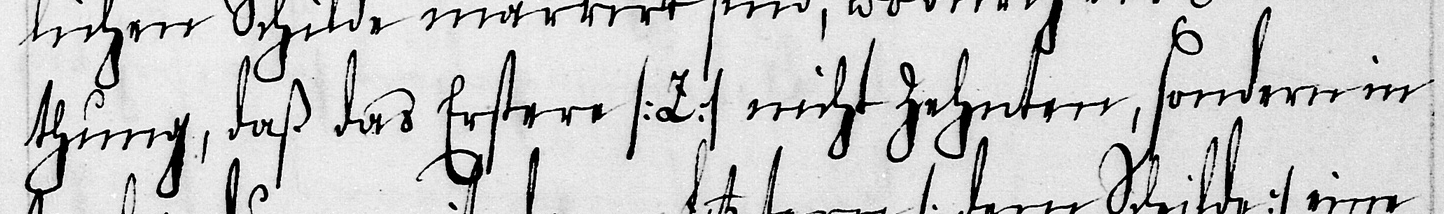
thung, daß das Erstere [Z] nicht Zehnten, sondern in
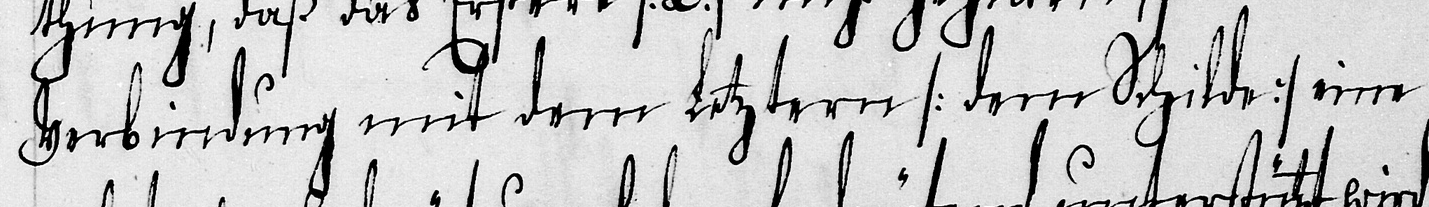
Verbindung mit dem Letztern [dem Schilde] eine
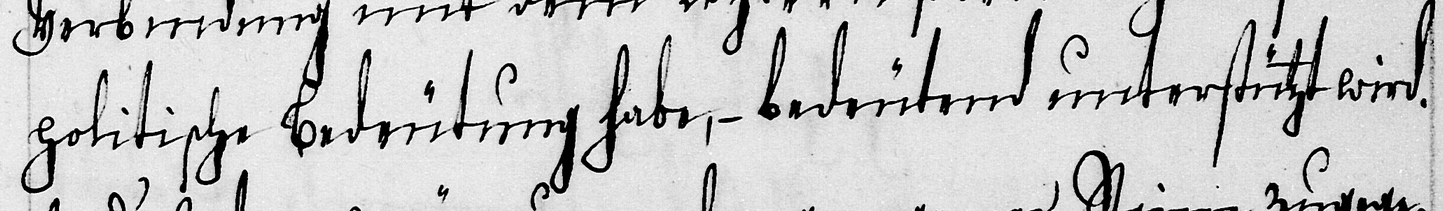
politische Bedeutung habe, – bedeutend unterstützt wir¬
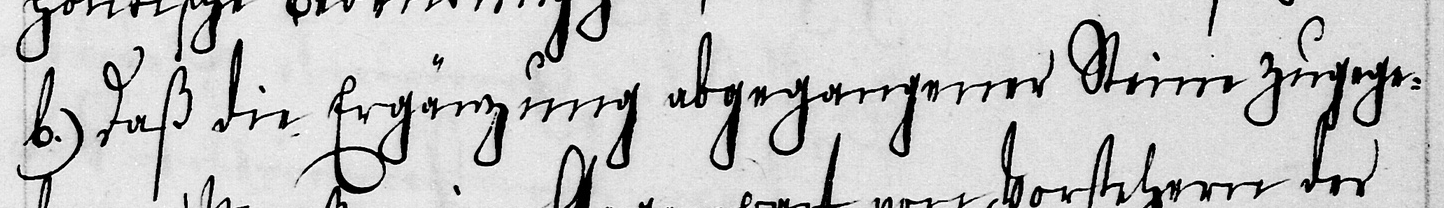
b.) Daß die Erwägung abgegangener Steine zugege¬
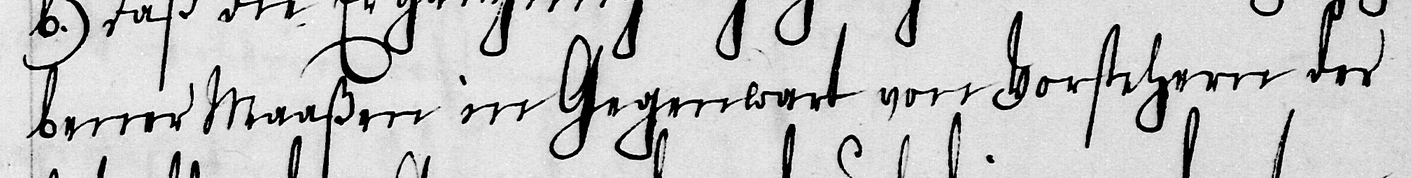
bener Maaßen in Gegenwart von Vorstehern der
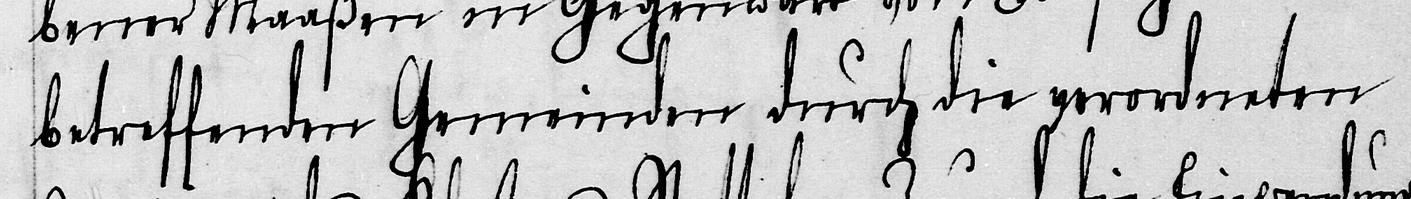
betreffenden Gemeinden durch die verordneten
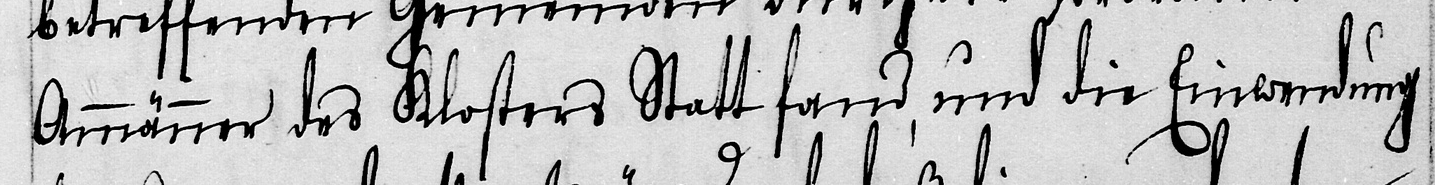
Ammänner des Klosters Statt fand, und die Einwendung
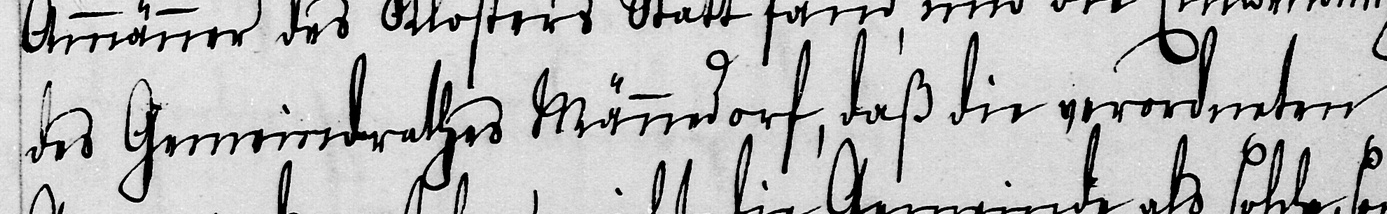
des Gemeindrathes Männedorf, daß die verordneten
